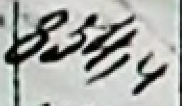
854,4
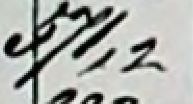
571,2
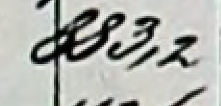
883,2
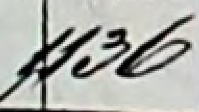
1136
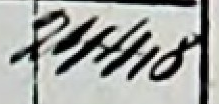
2114,8
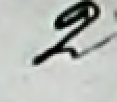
2
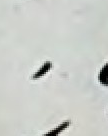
.
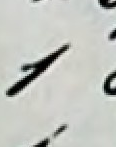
1
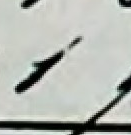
1
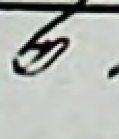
6
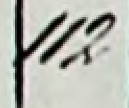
112
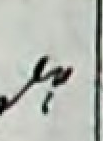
do
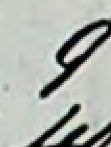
9
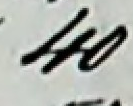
40
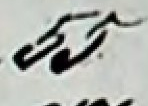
55
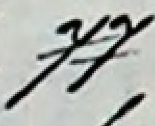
77
